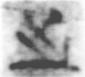之
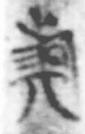○（旗）
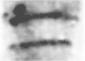二
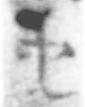屯
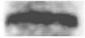一
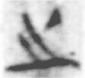之
